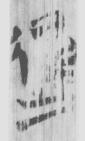歸
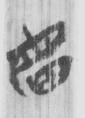{母田}
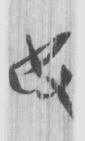奴
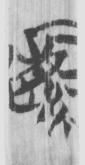{每糸}
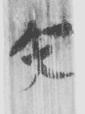內
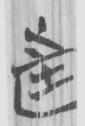市
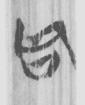句
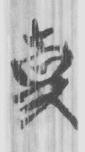吏
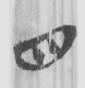四
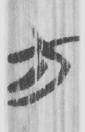方
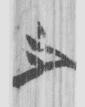之
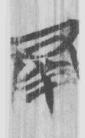羣
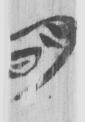明
